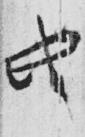女（如）
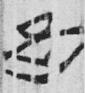是
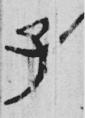子
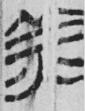羔
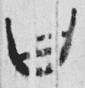曰
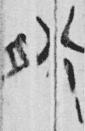肰（然）
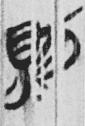則（則）
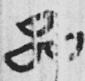厽（三）
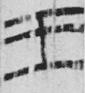王
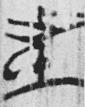者
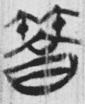○（孰）
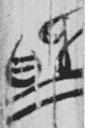爲
